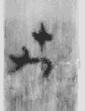{十九}
